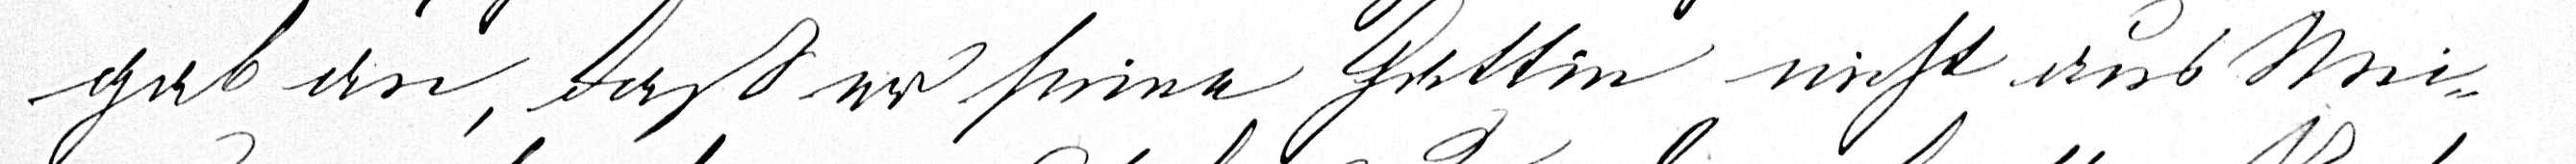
gab an, daß er seine Gattin nicht aus Stei¬
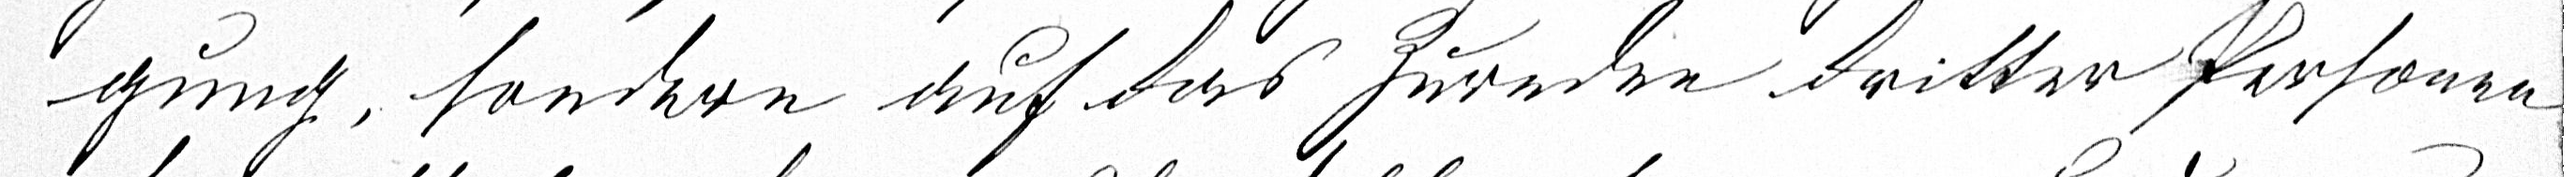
gung, sondern auf das Zureden dritter Personen
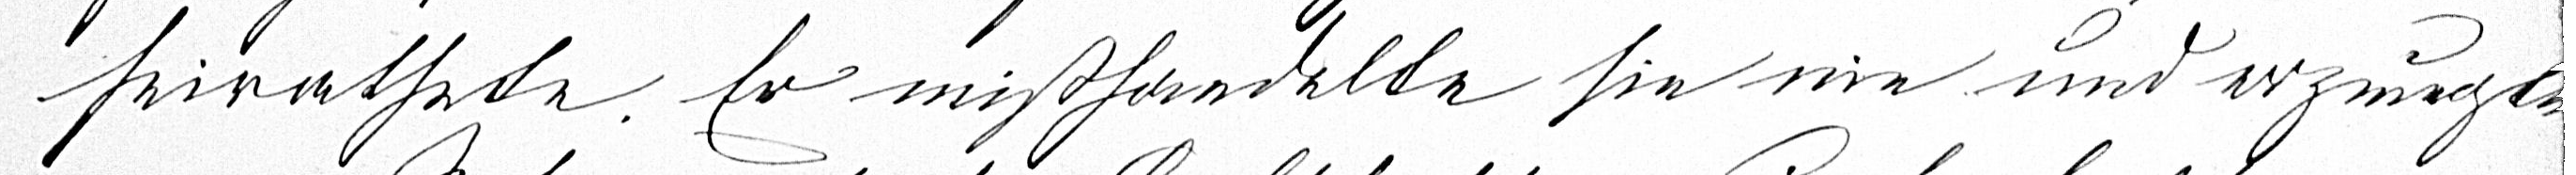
heirathete. Er mißhandelte sie nie und erzeugte
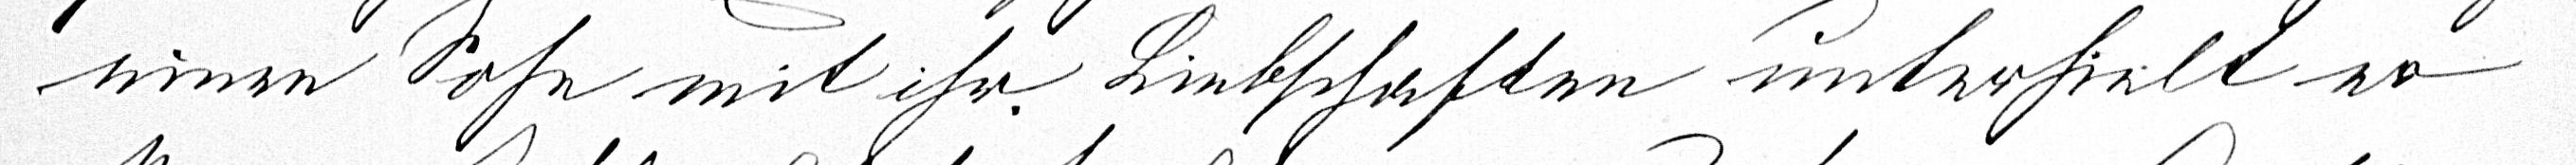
einen Sohn mit ihr. Liebschaften unterfielt er
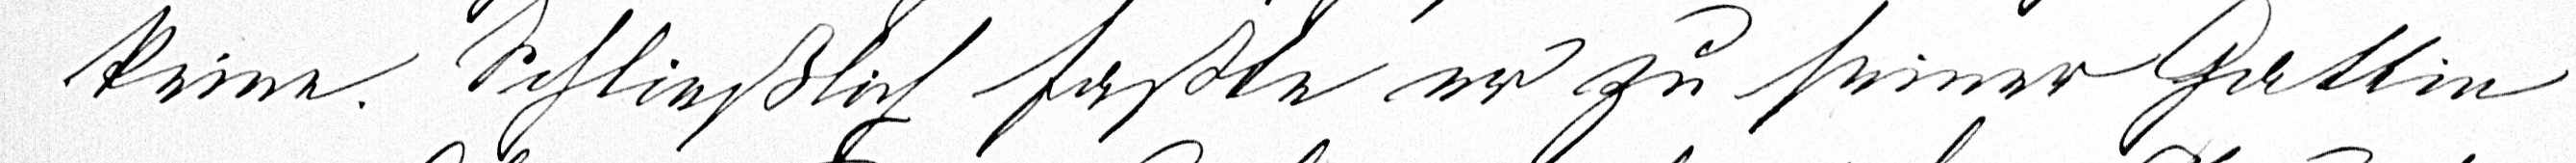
keine. Schließlich faßte er zu seiner Gattin
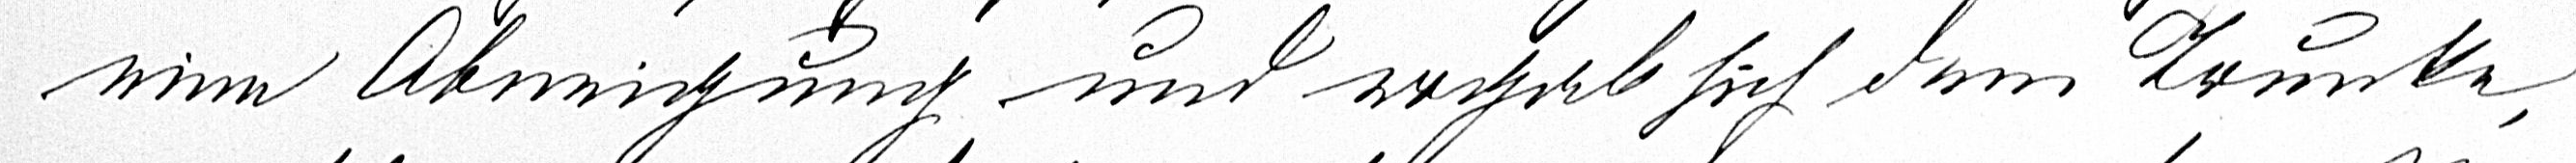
eine Abweigung und ergab sich dem Trunke,
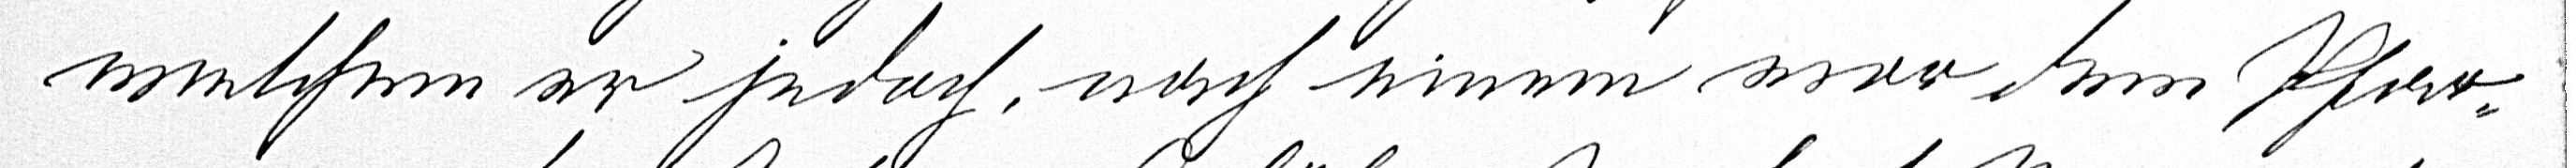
welchem er jedoch, nach einem war dem Pfar¬
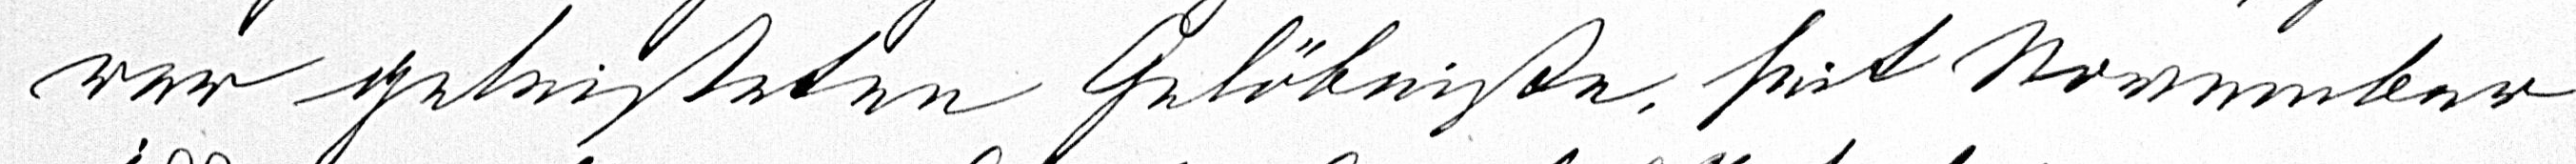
rer geleisteten Gelöbniße, seit November
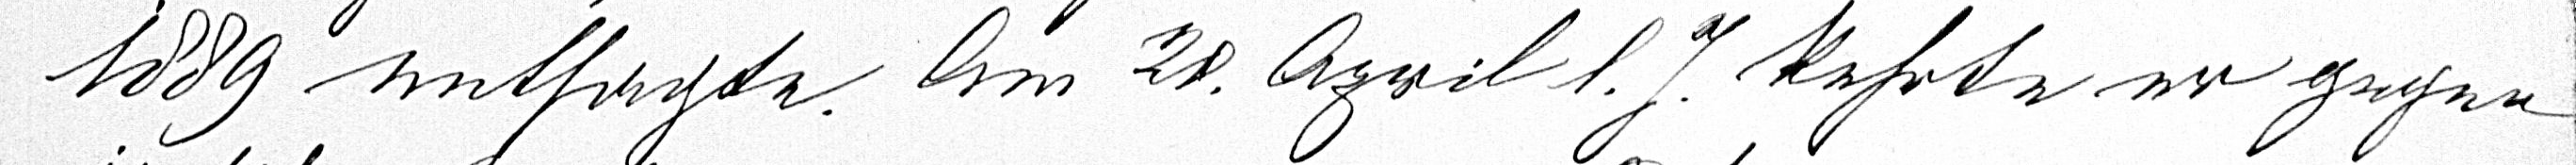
1889 entsagte. Am 20. April l. J. kehrte er gegen
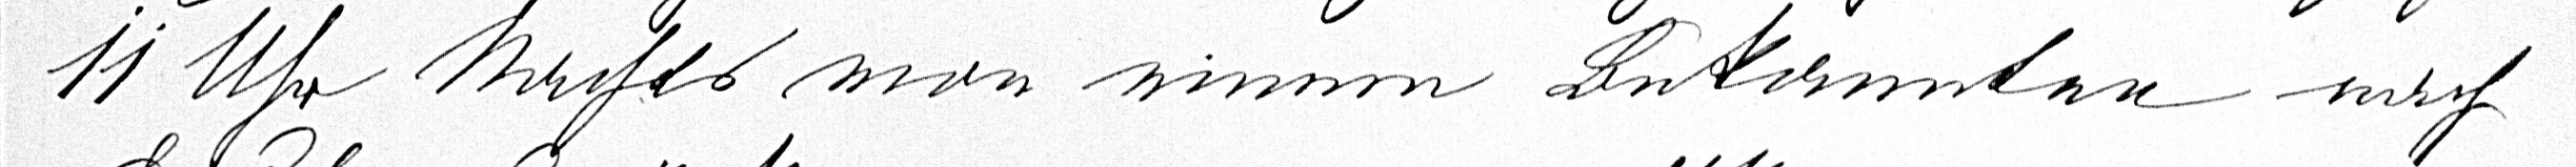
11 Uhr Nachts von einem Bekannten nach
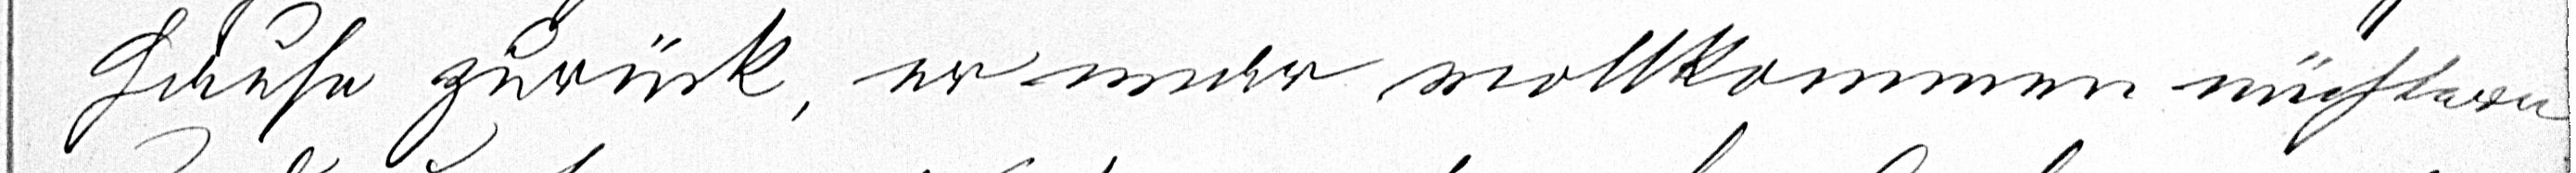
Hause zurück, er war vollkommen mühlxx
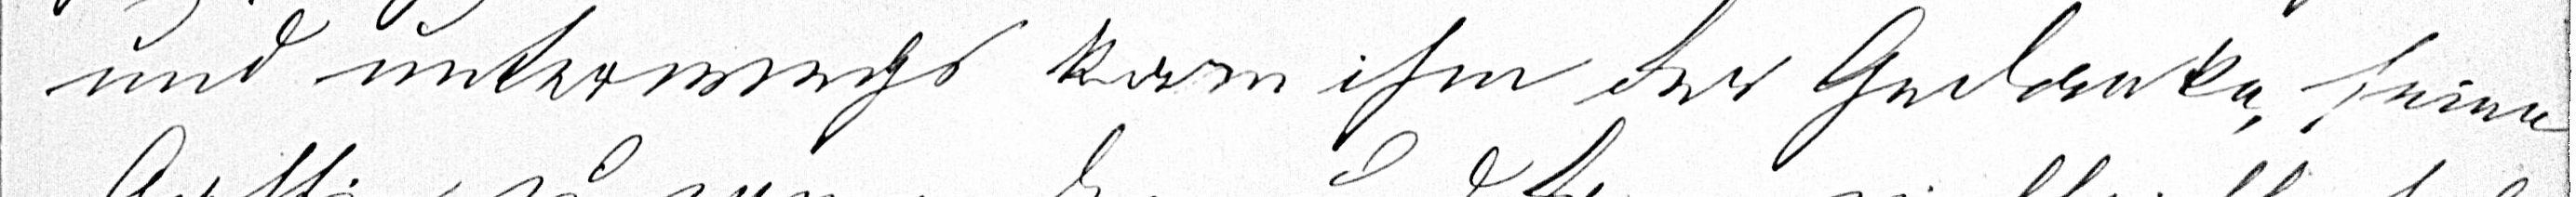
und unterwegs kam ihm der Gedanke, seine
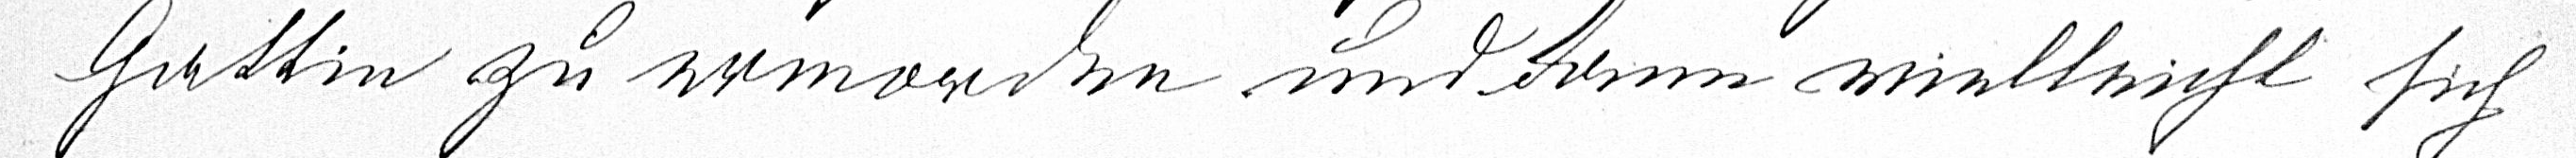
Gattin zu ermorden und dann vielleicht sich
